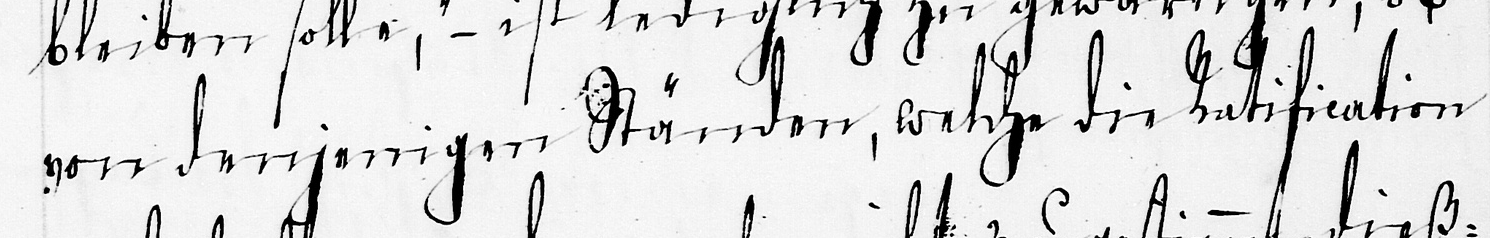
von denjenigen Ständen, welche die Ratification
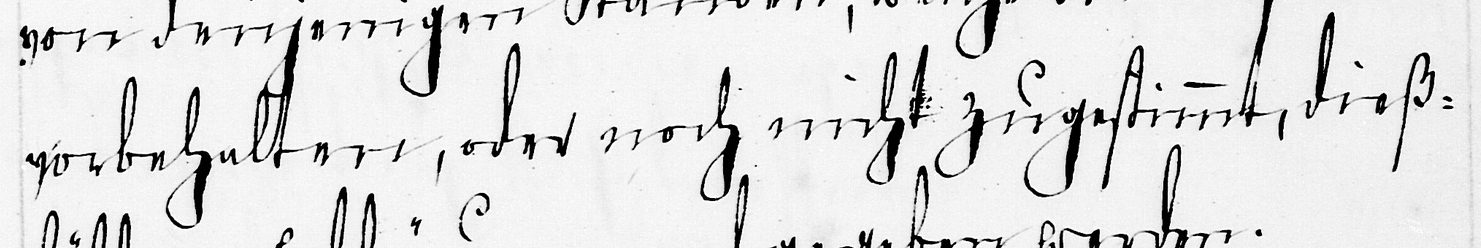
vorbehalten, oder noch nicht zugestimmt, dieß¬
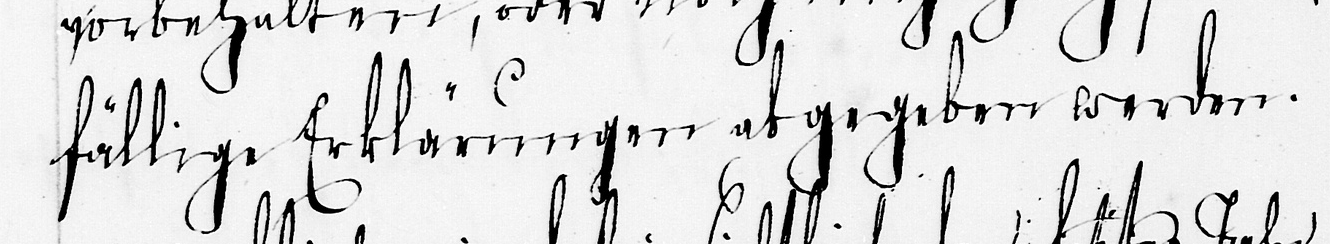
fällige Erklärungen abgegeben werden.
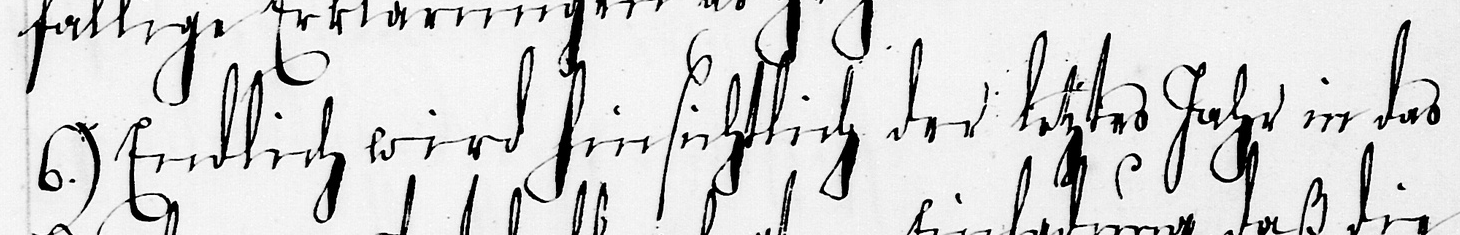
Endlich wird hinsichtlich der letztes Jahr
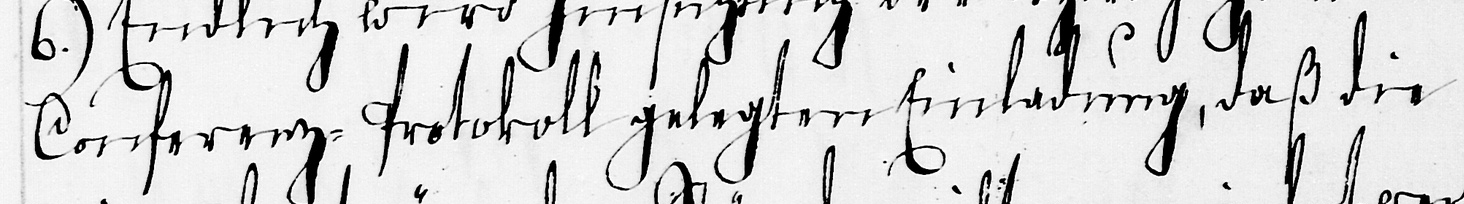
Conferenz-Protokoll gelegten Einladung, daß die
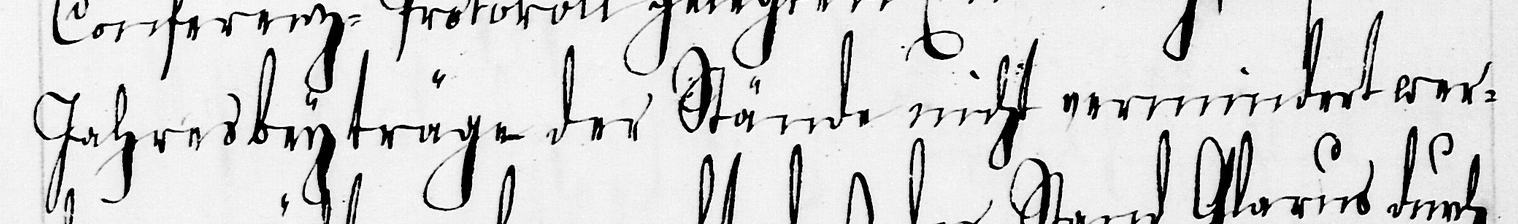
Jahresbeyträge der Stände nicht vermindert wer¬
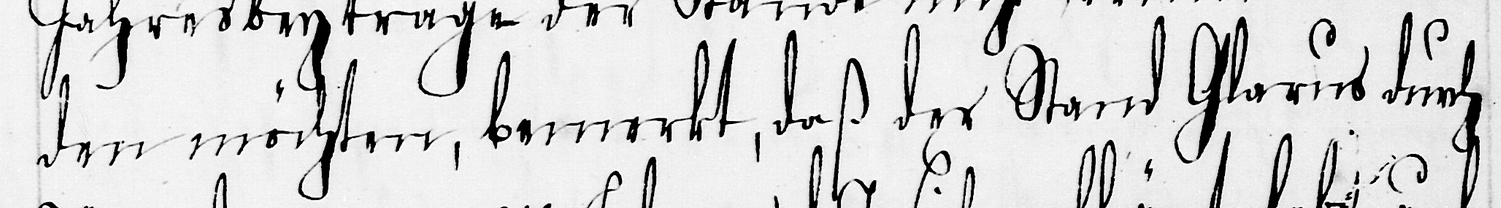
den möchten, bemerkt, daß der Stand Glarus durch
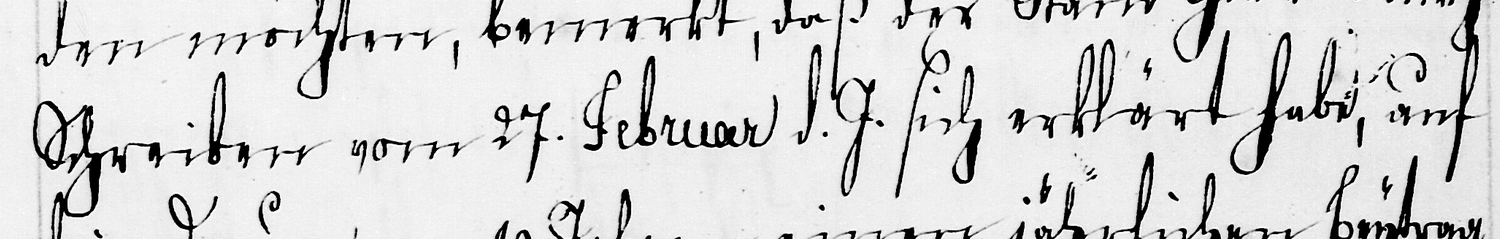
Schreiben vom 27. Februar d. J. sich erklärt habe, auf
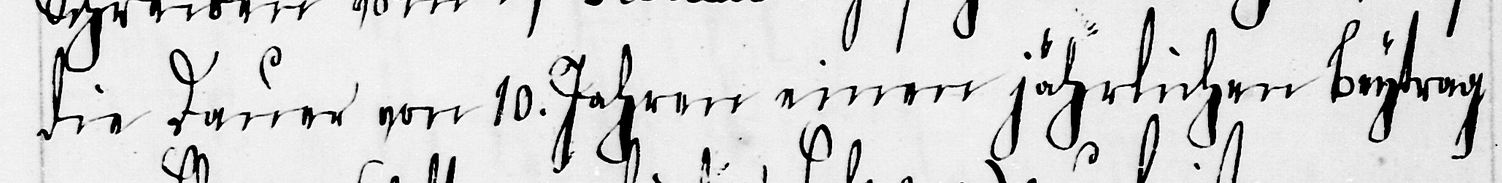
die Dauer von 10. Jahren einen jährlichen Beytrag
